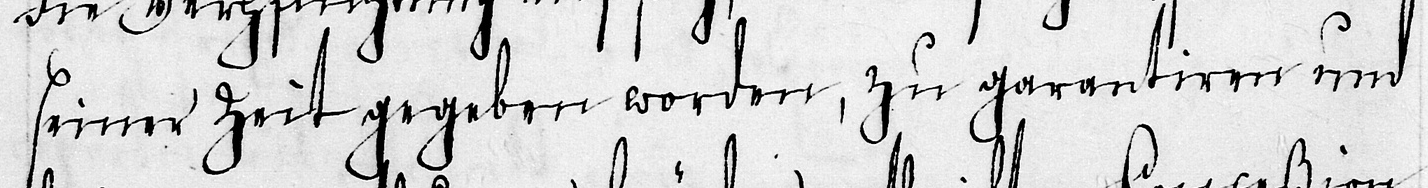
seiner Zeit gegeben worden, zu garantiren und
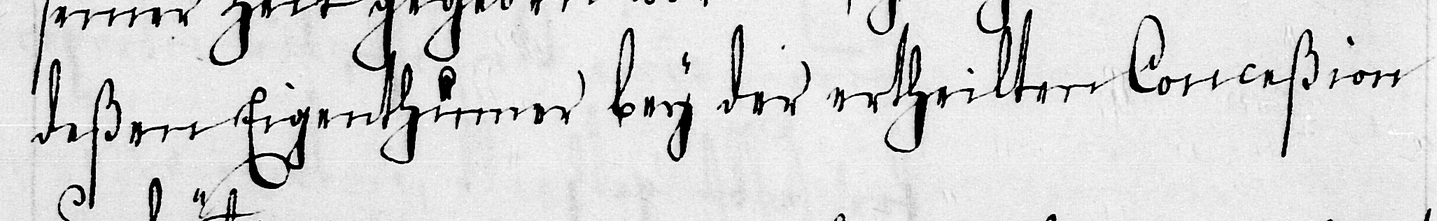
deßen Eigenthümer bey der ertheilten Conceßion
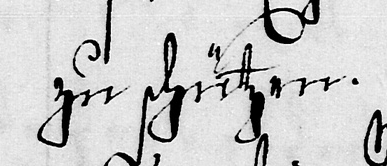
zu schützen.
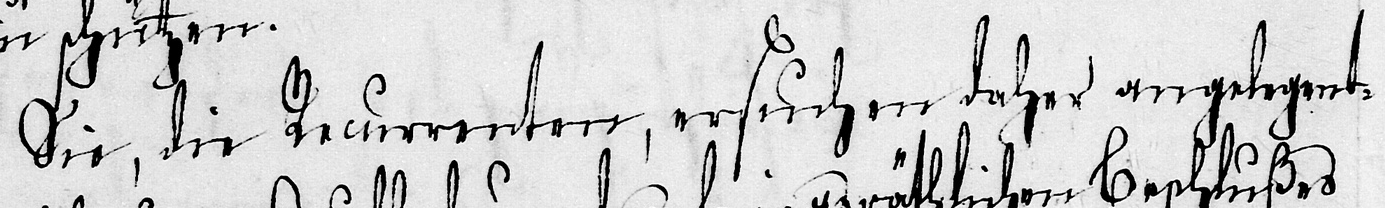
Sie, die Recurrenten, ersuchen daher angelegent¬
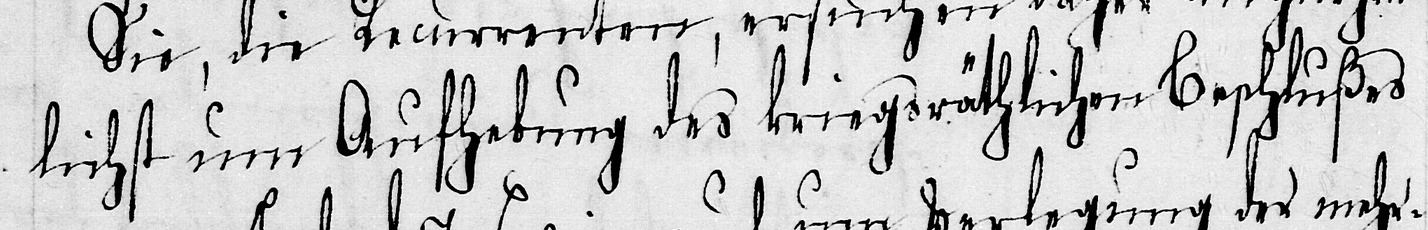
lichst um Aufhebung des kriegsräthlichen Beschlußes
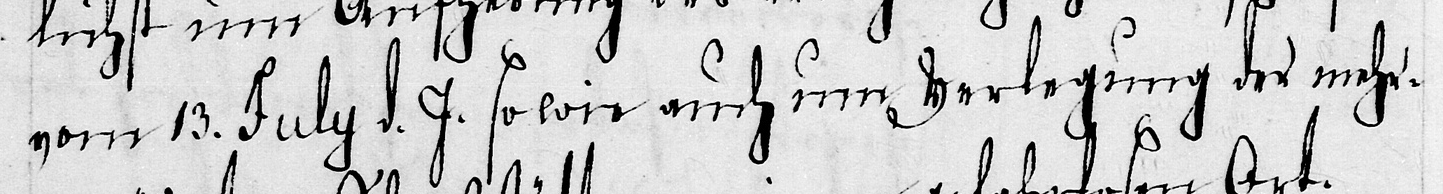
vom 13. July. d. J. sowie auch um Verlegung der mehr¬
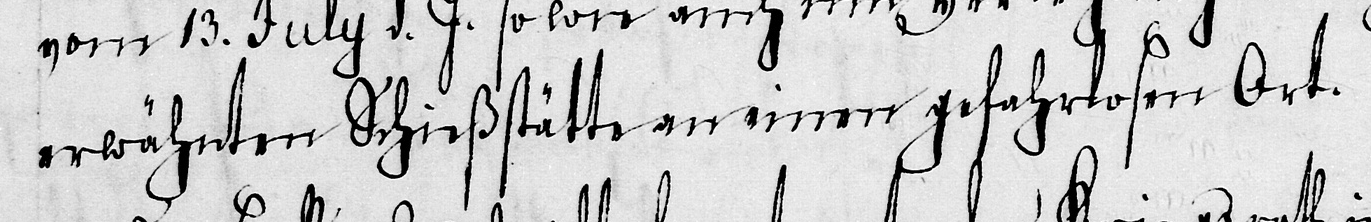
erwähnten Schießstätte an einen gefahrlosen Ort.
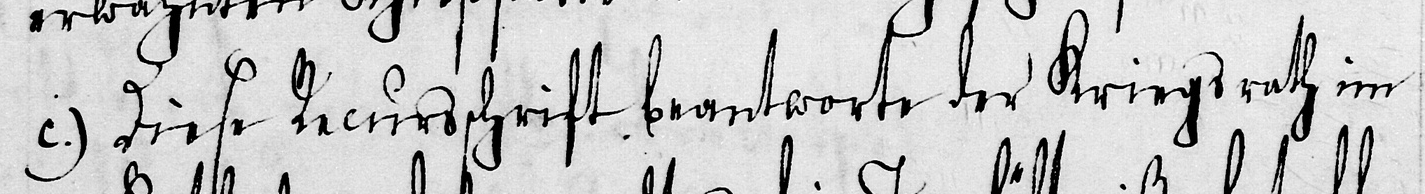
c.) Diese Recursschrift beantwortete der Kriegsrath im
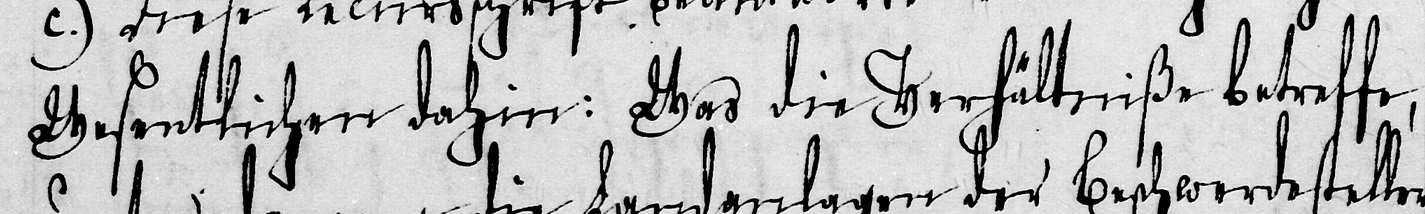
Wesentlichen dahin: Was die Verhältniße betreff¬
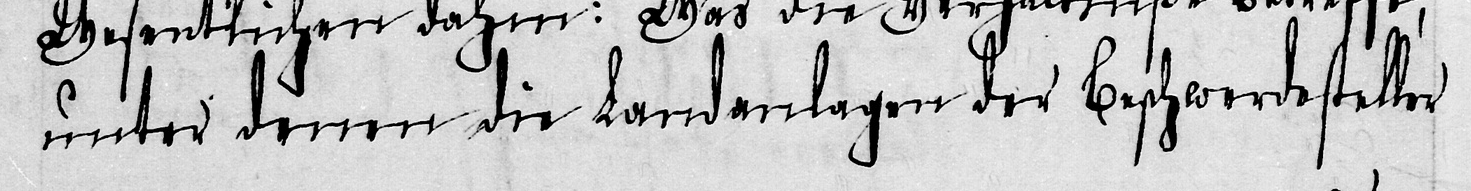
unter denen die Landanlagen der Beschwerdesteller
